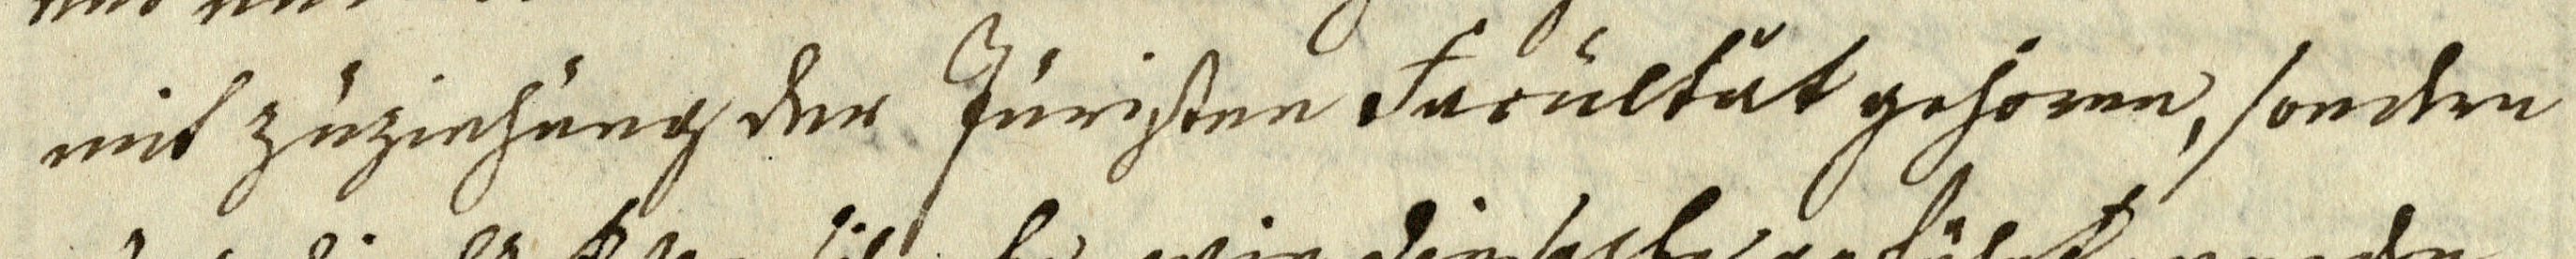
mit Zuziehung derJuristen Facultät gehören, sondern
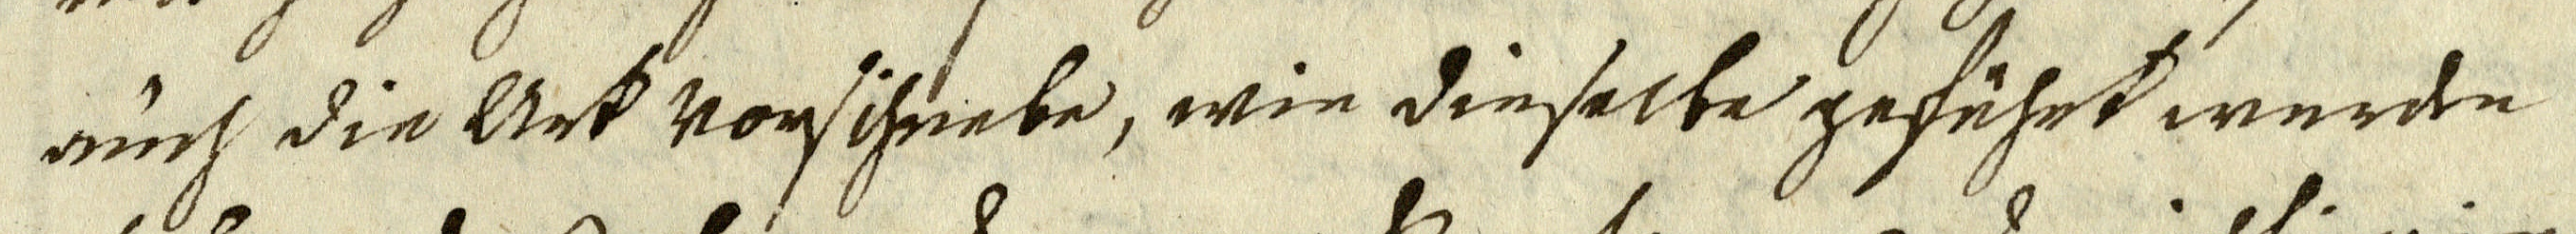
auch die Art vorschriebe, wie dieselbe geführt werden
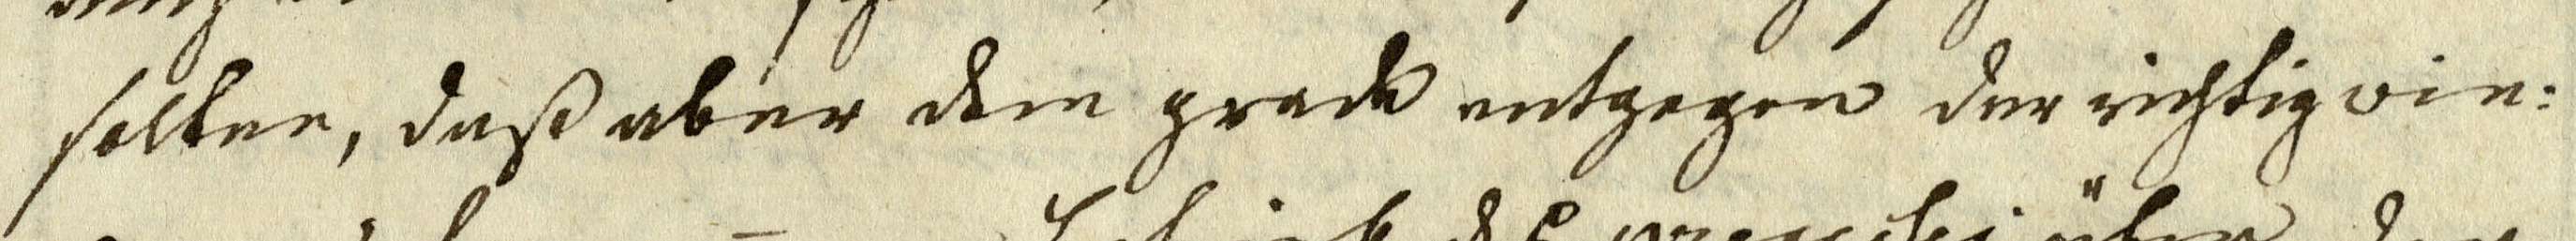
solten, daß aber dem grade entgegen der richtig wie¬
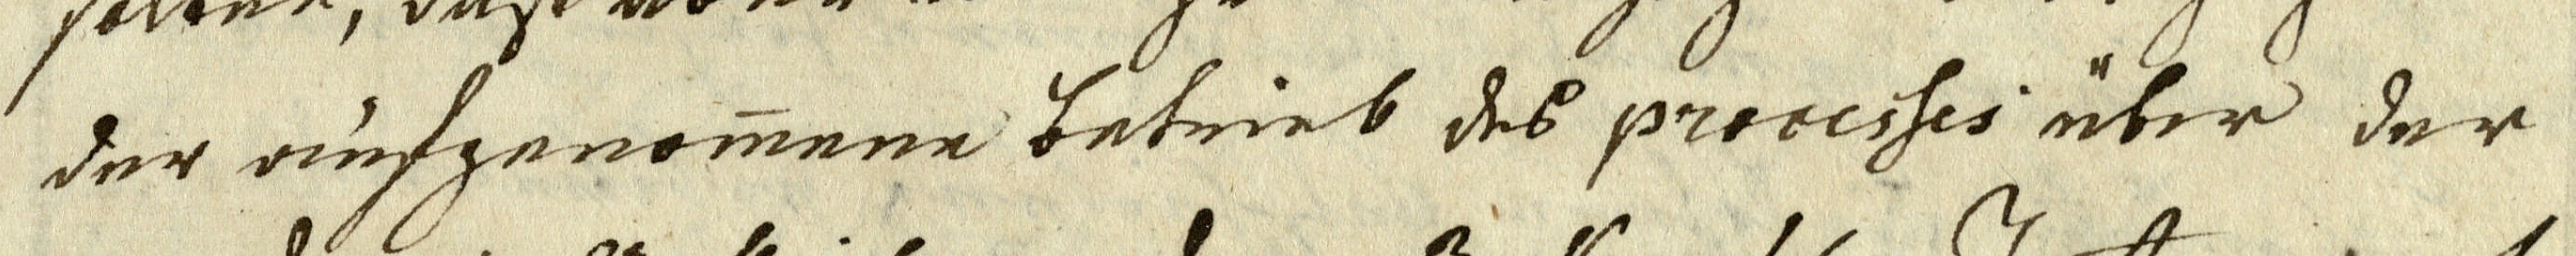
der aufgenommene Betrieb des processes über der
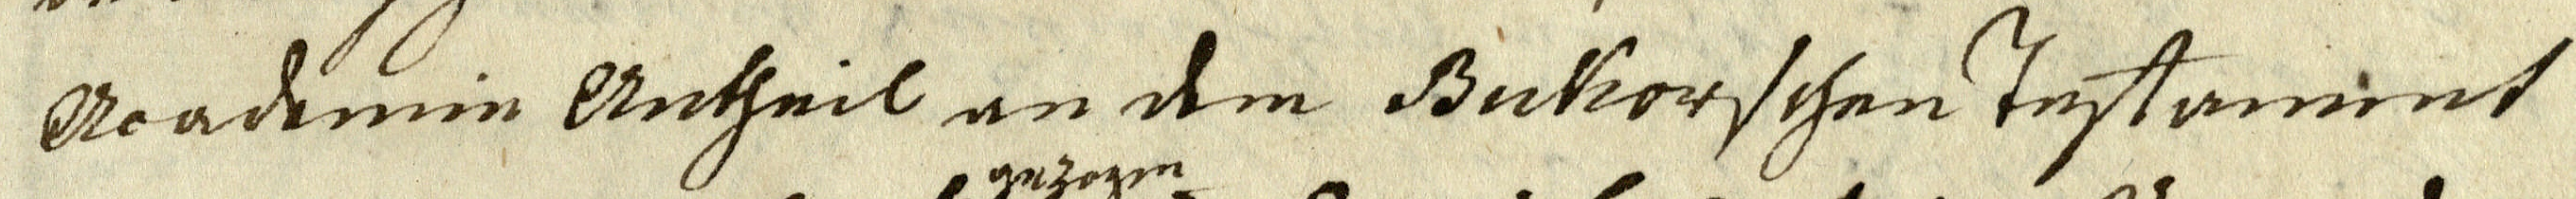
Academie Antheil an dem Bukowschen Testament
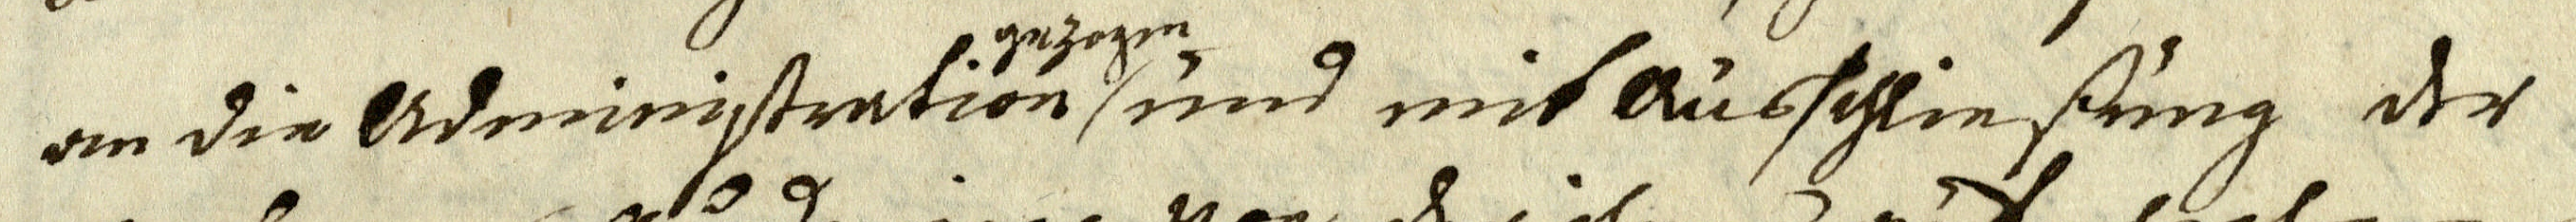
an die Administration gezogen und mit Ausschließung der
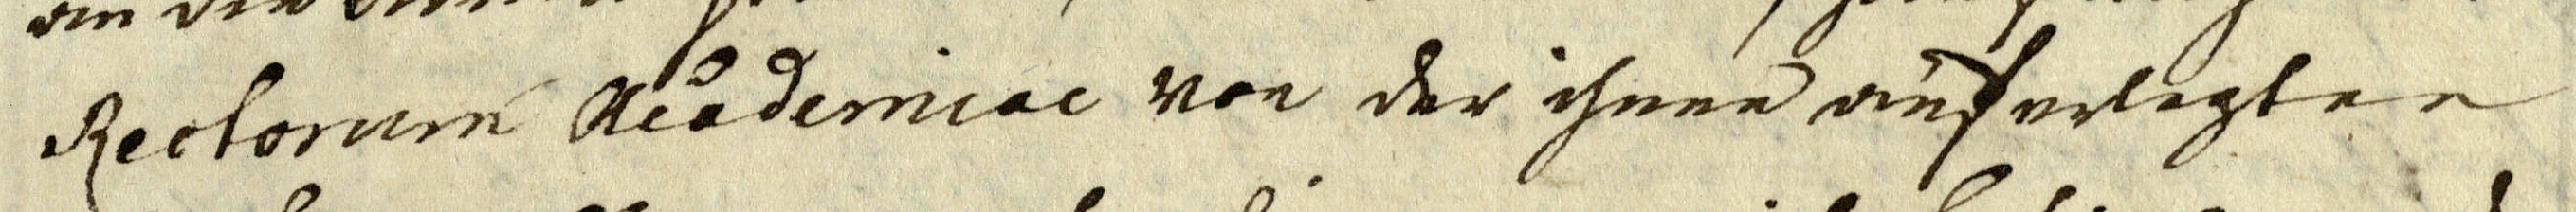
Rectorum Academiae von der ihnen auferlegten
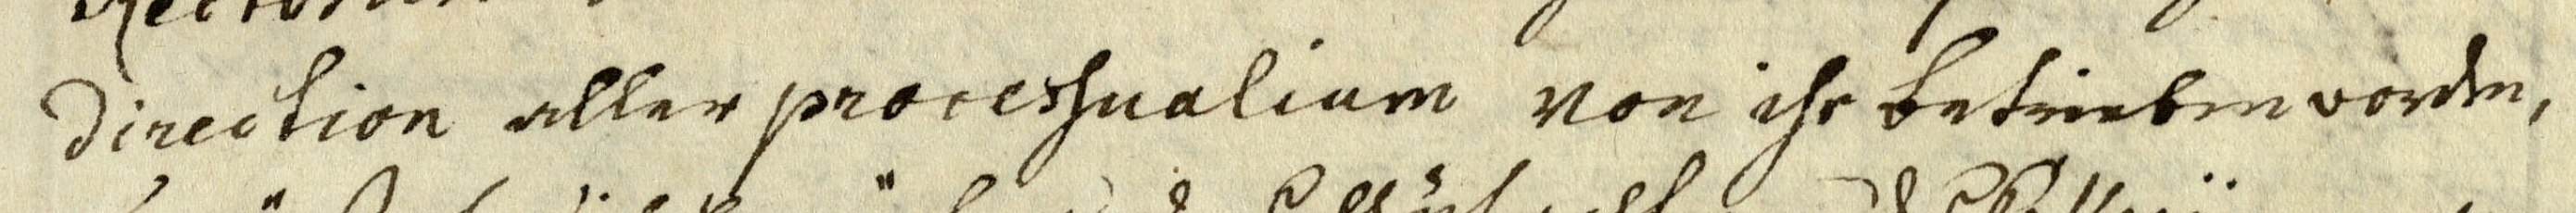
direction aller processualium von ihr betrieben worden,
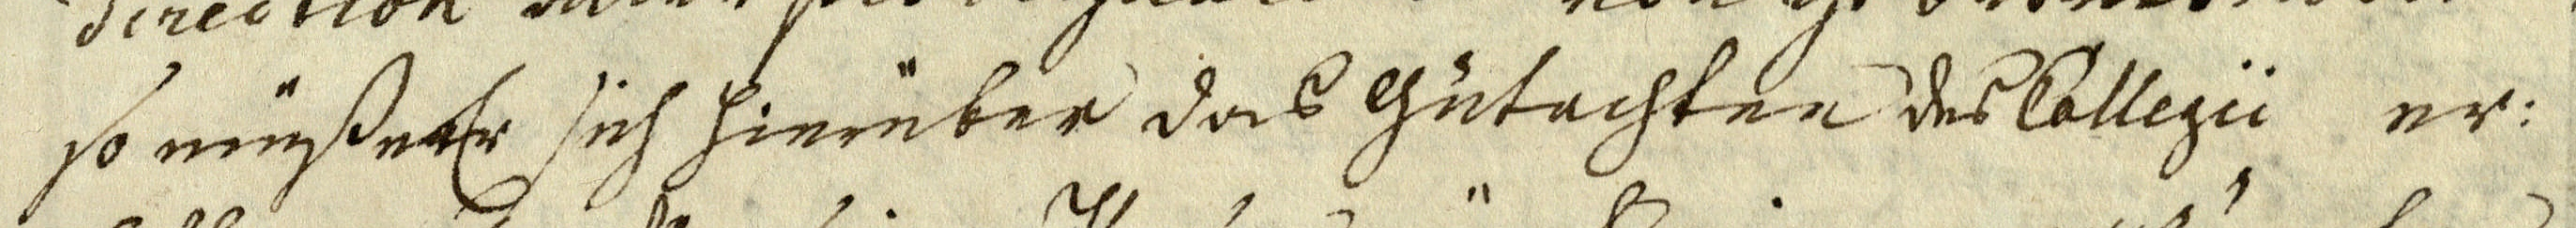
so müße Er sich hierüber das Gutachten des Collegii er¬
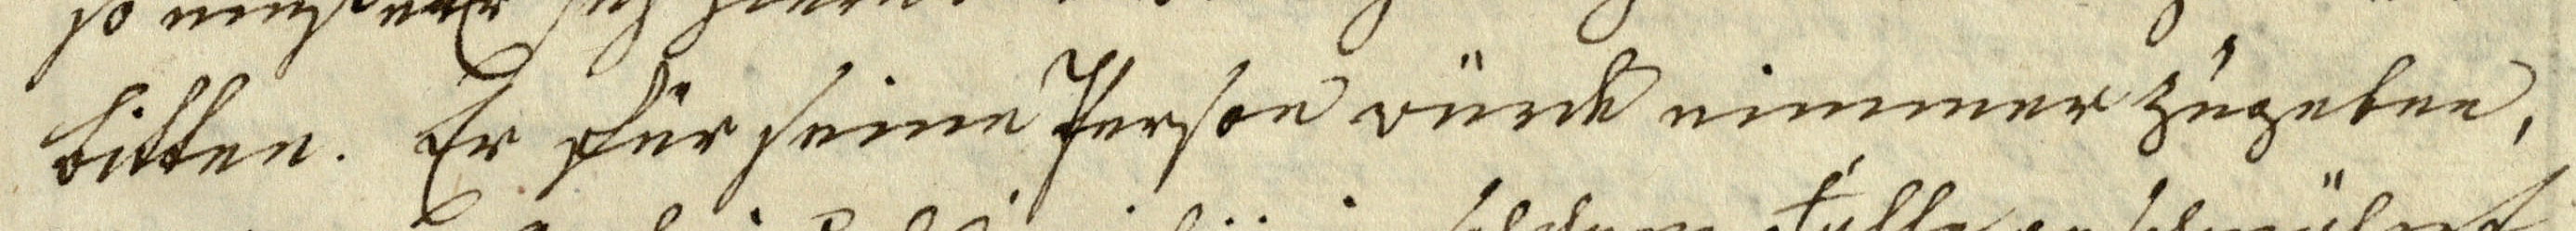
bitten. Er für seine Person würde nimmer zugeben,
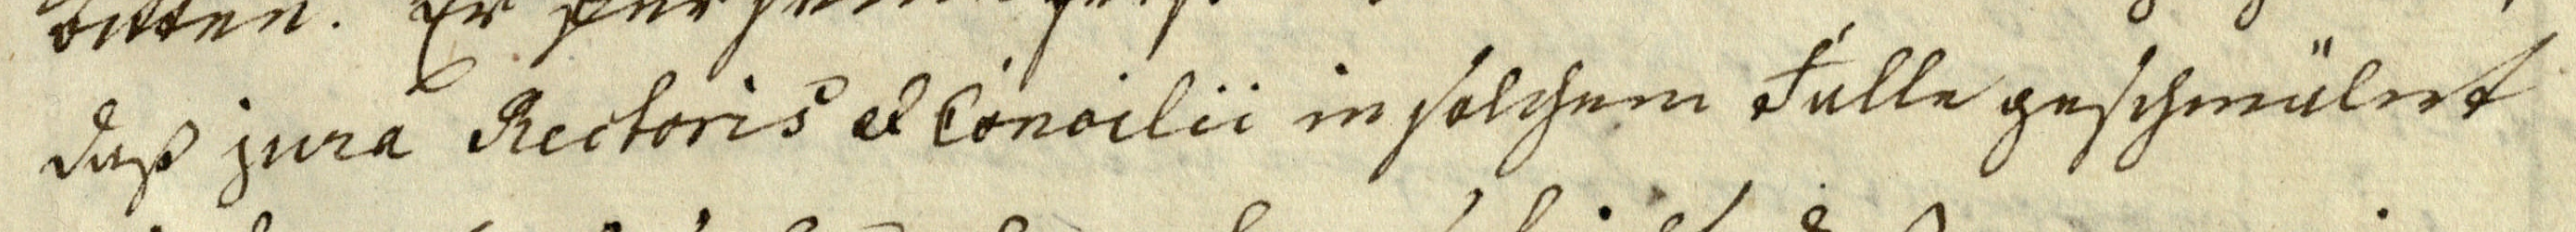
daß jura Rectoris et Concilii in solchem Falle geschmälert
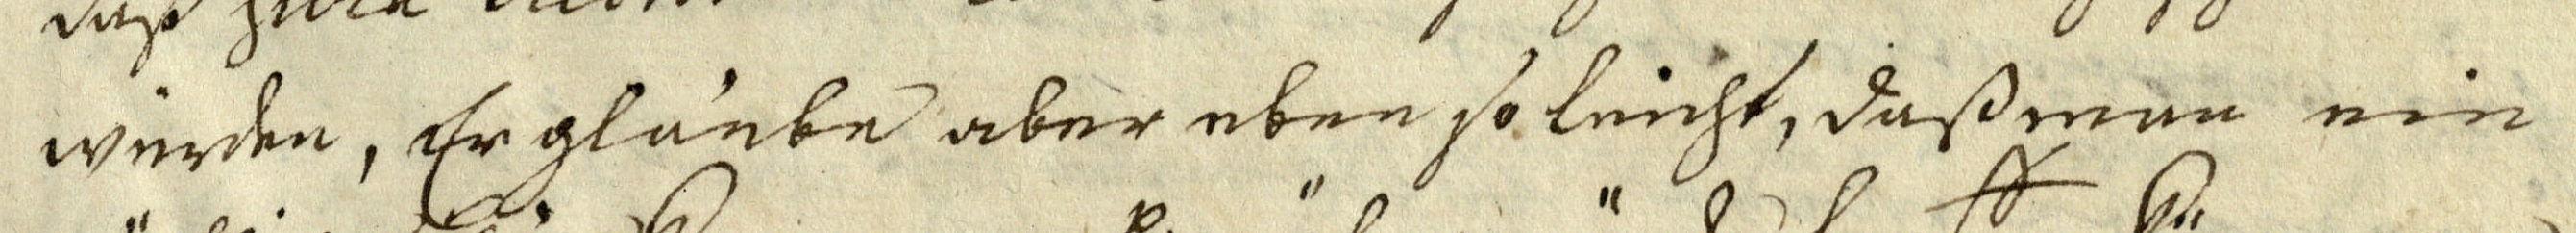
würden, Er glaube aber eben so leicht, daß man ein
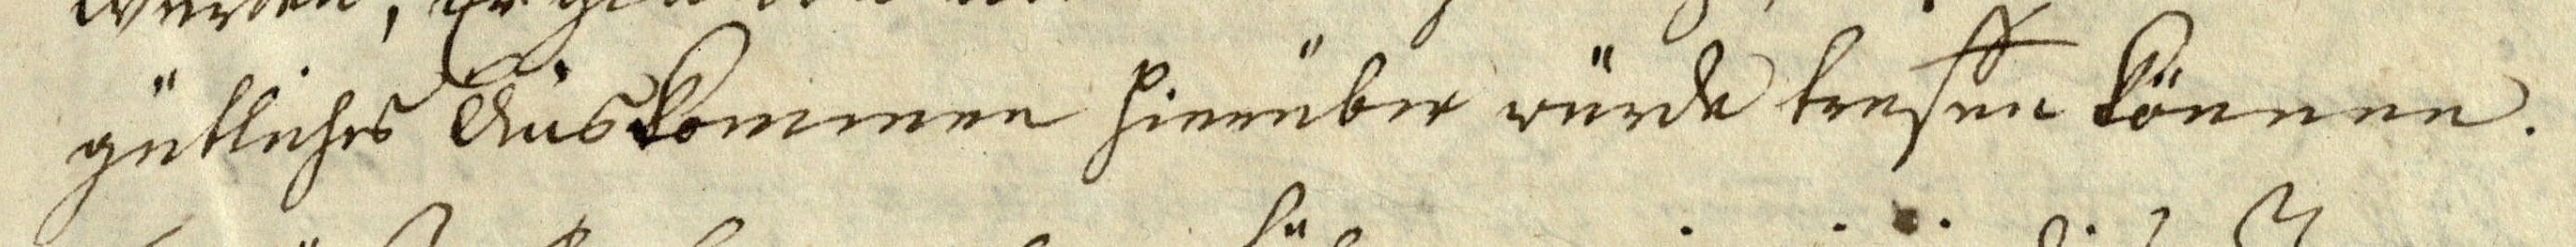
gütliches Auskommen hierüber würde treffen können.
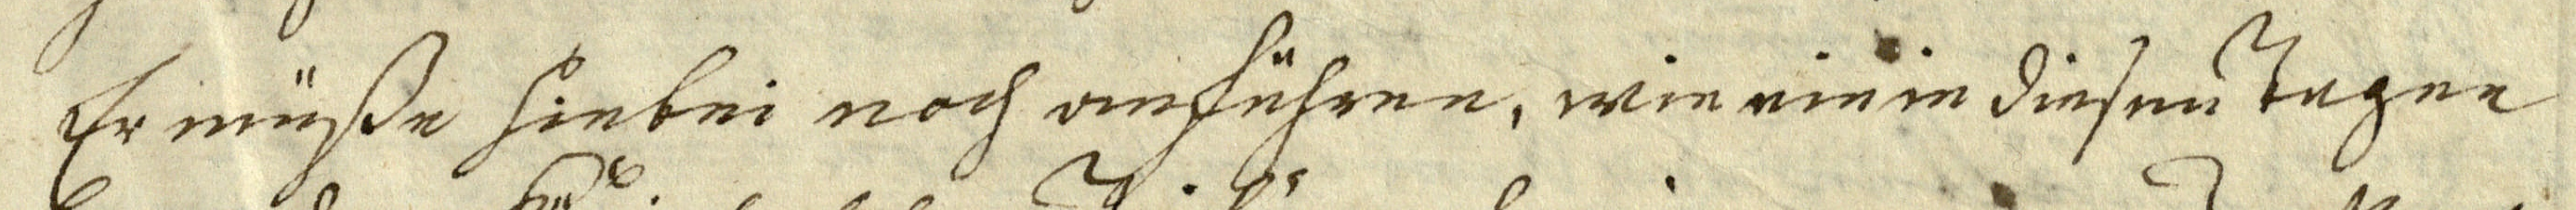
Er müße hiebei noch anführen, wie ein in diesen Tagen
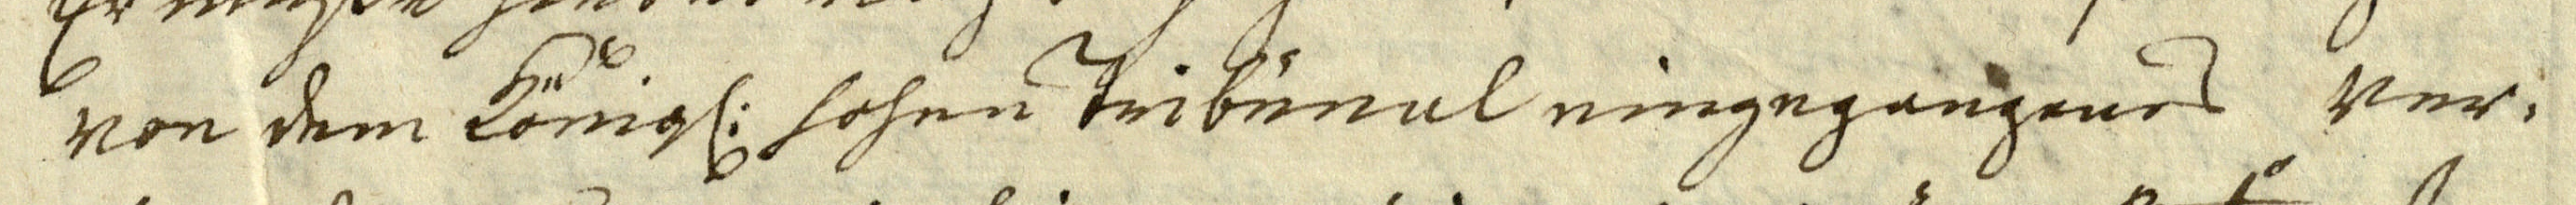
von dem Königl. hohen Tribunal eingegangenes ver¬
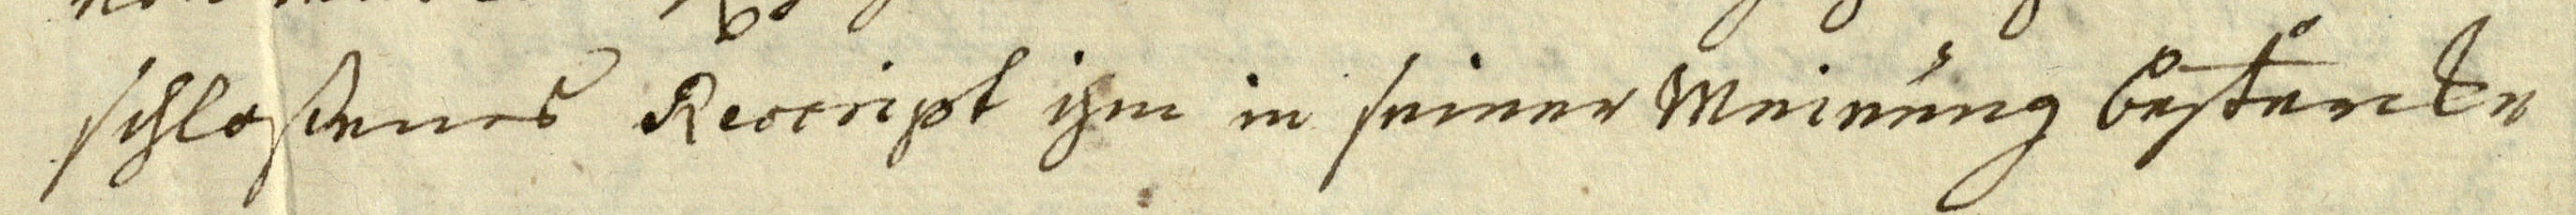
schloßenes Rescript ihm in seiner Meinung bestercke
